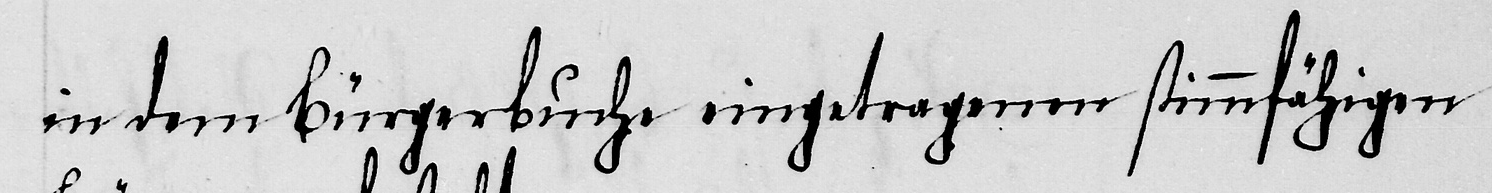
in dem Bürgerbuche eingetretenen stimmfähigen
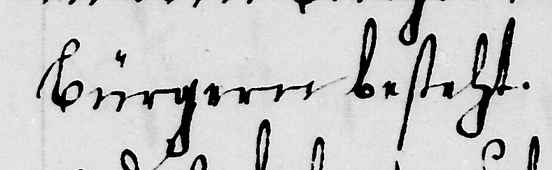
Bürgern besteht.
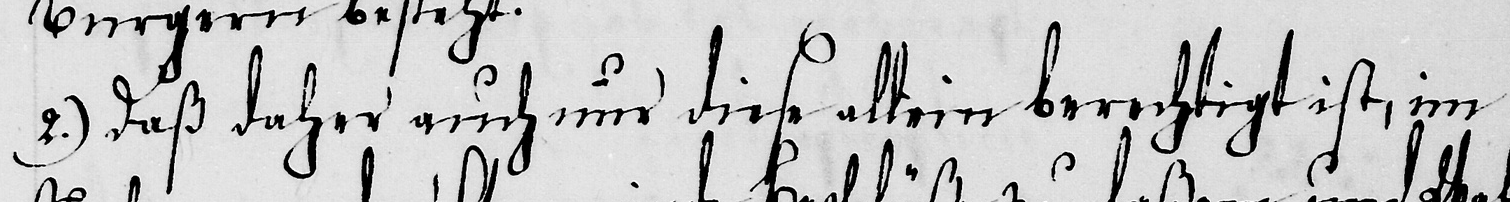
2.) Daß daher auch nur diese allein berechtigt ist, im
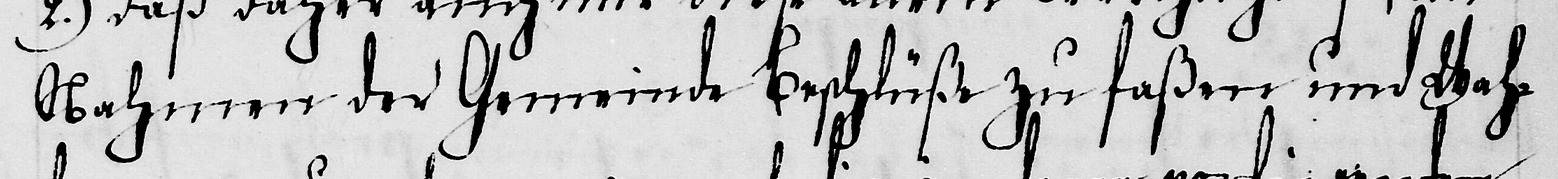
Nahmen der Gemeinde Beschlüße zu faßen und Wah¬
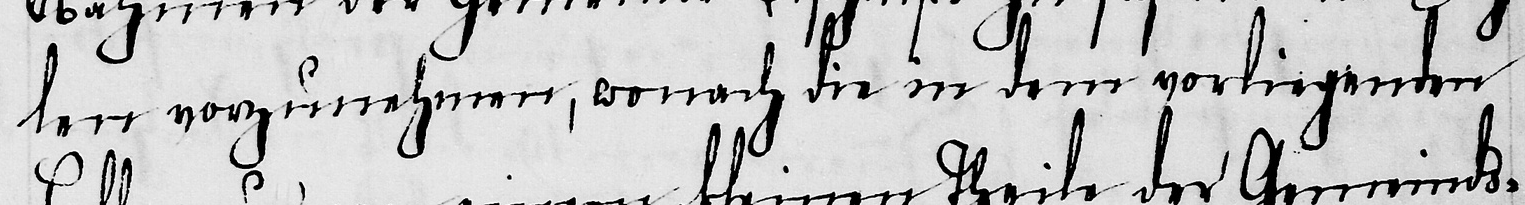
len vorzunehmen, wonach die in dem vorliegenden
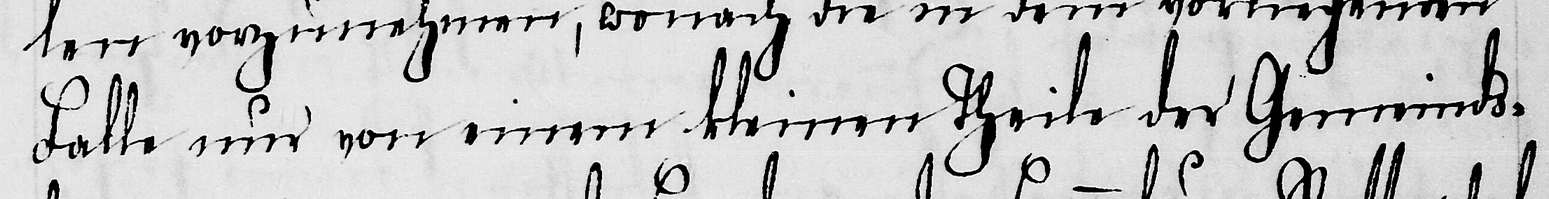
Falle nur von einem kleinen Theile der Gemeinds¬
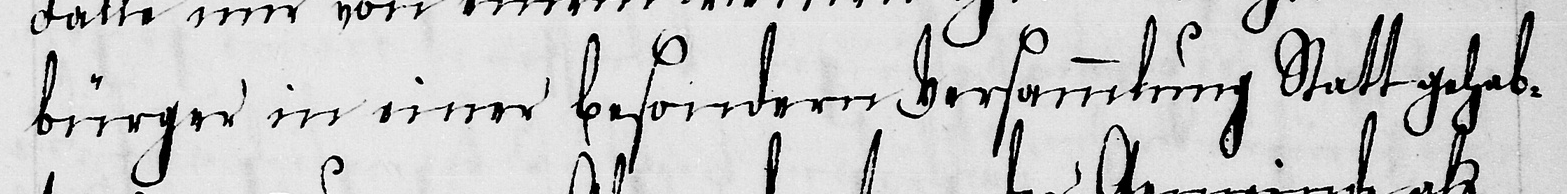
bürger in einer besondern Versammlung Statt gehab¬
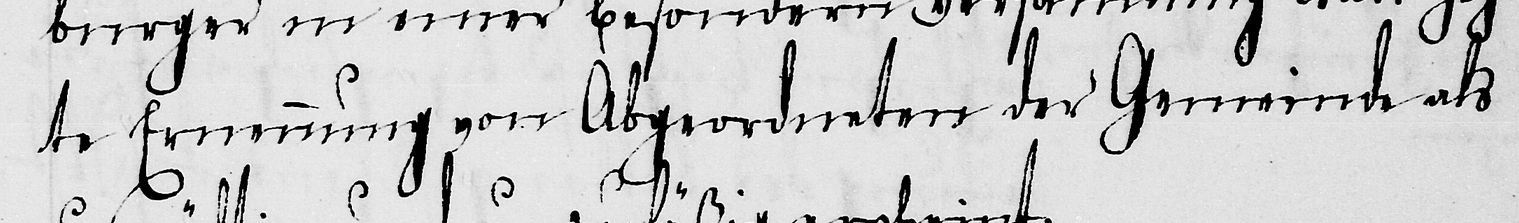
te Ernennung von Abgeordneten der Gemeinde als
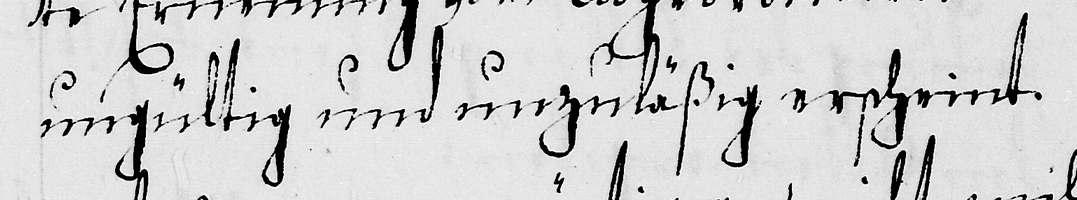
ungültig und unzuläßig erscheint.
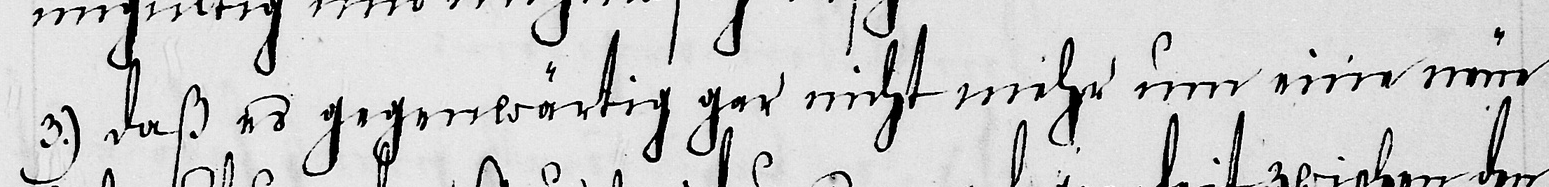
3.) daß es gegenwärtig gar nicht mehr um eine neue
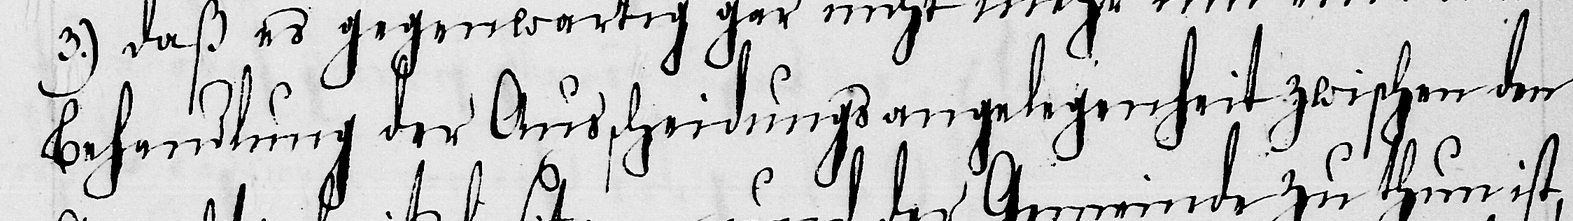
Behandlung der Ausscheidungsangelegenheit zwischen den
